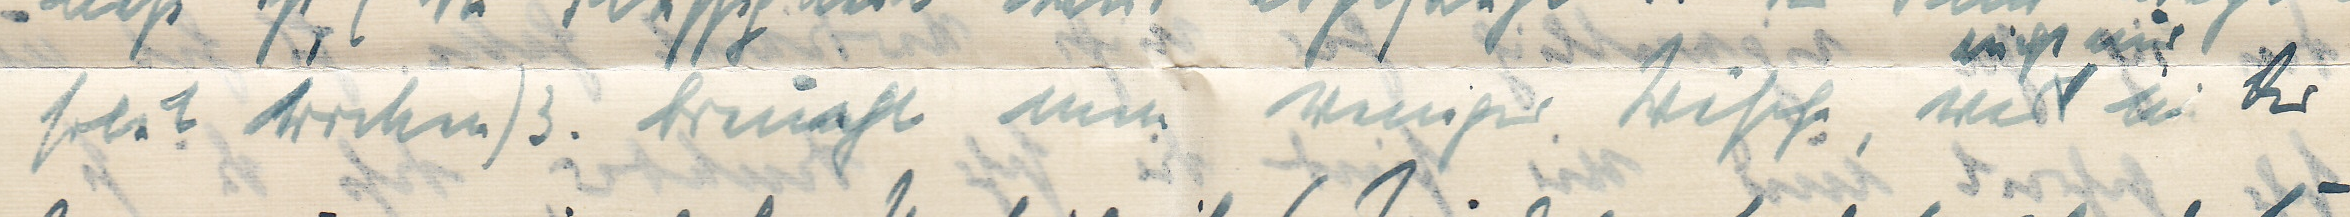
oet irs. nahtspnrirg[r.
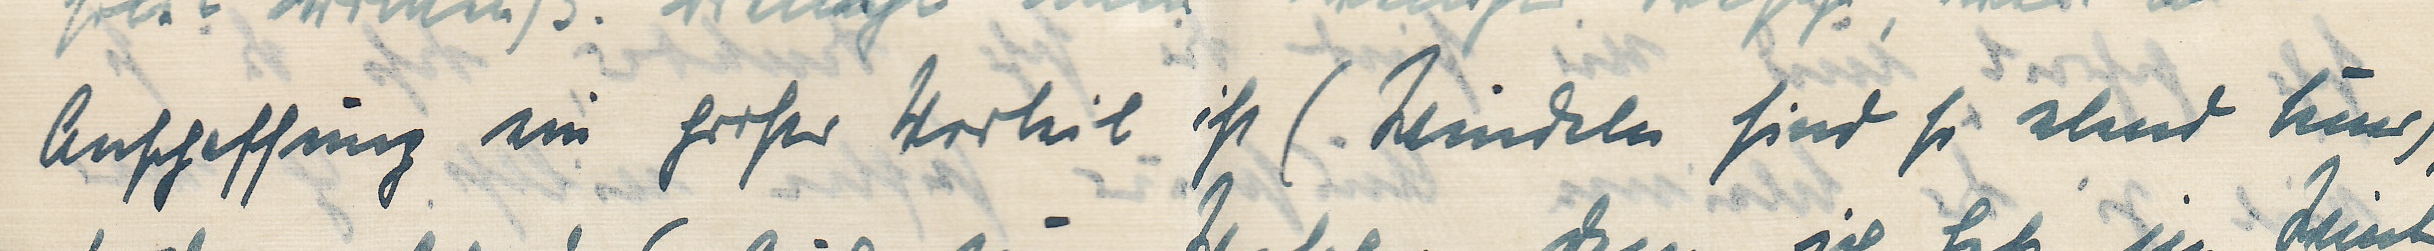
rschfsn, Di son Urtie l2. t ( indeln, ich 1 eme e,
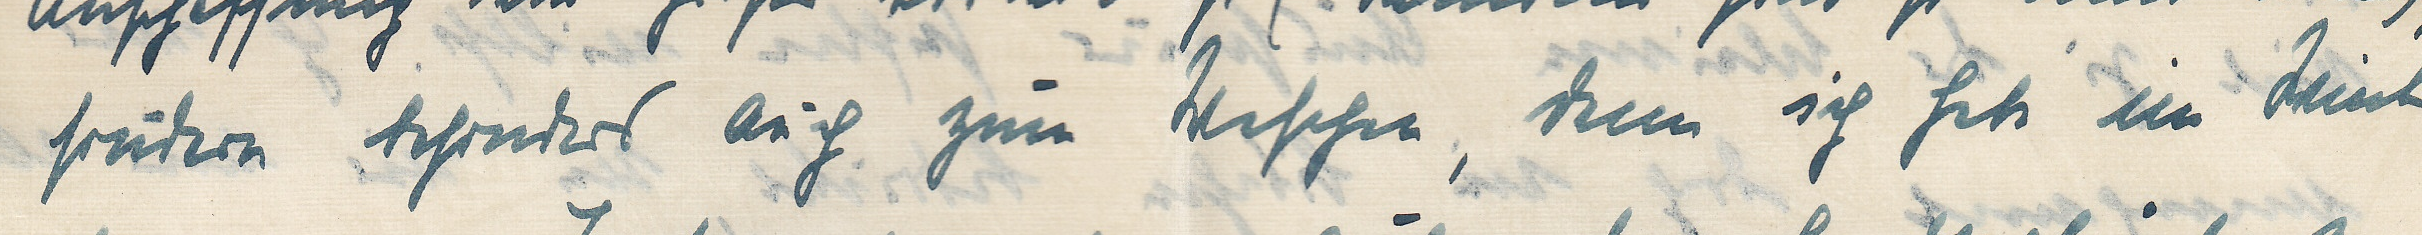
steüteen bchacderAih sen. Rischen n z it. die Sir
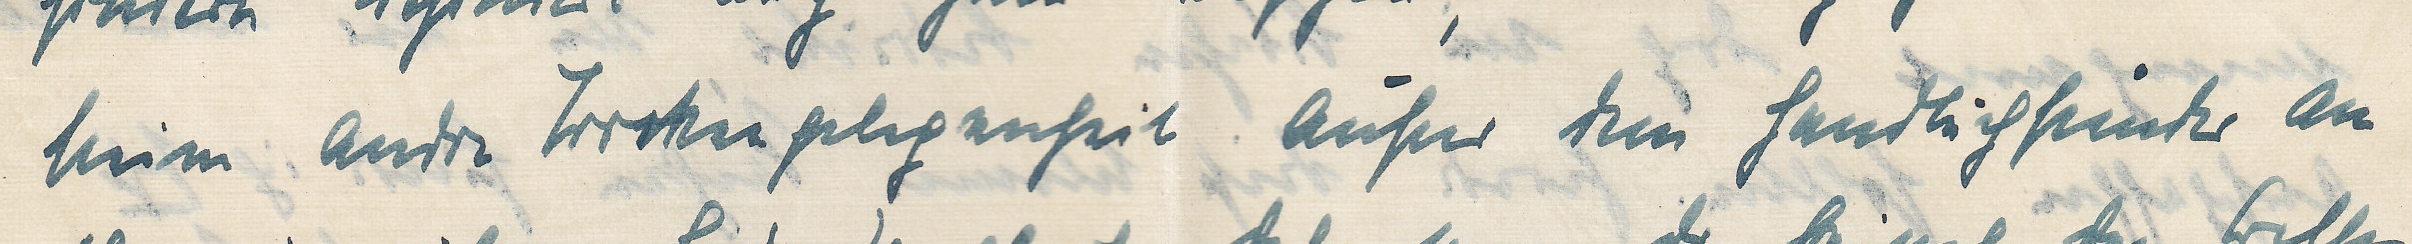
tnie. Asre n selis enheit nusn i Jend Phsuk n
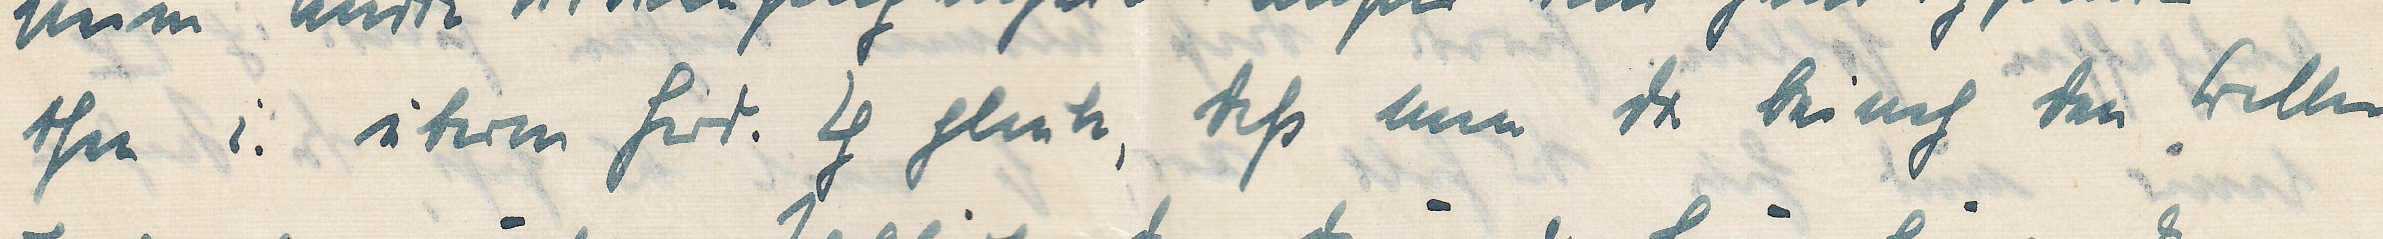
n iser hrd h fürt, h n u Kr eiMln¬
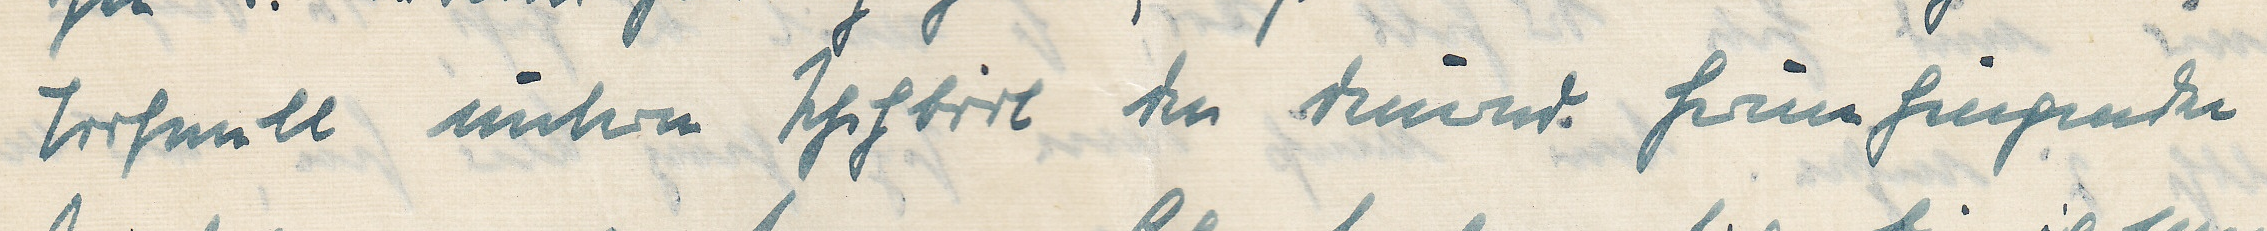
r.l ntn boeh 12 tn Am hn hr he
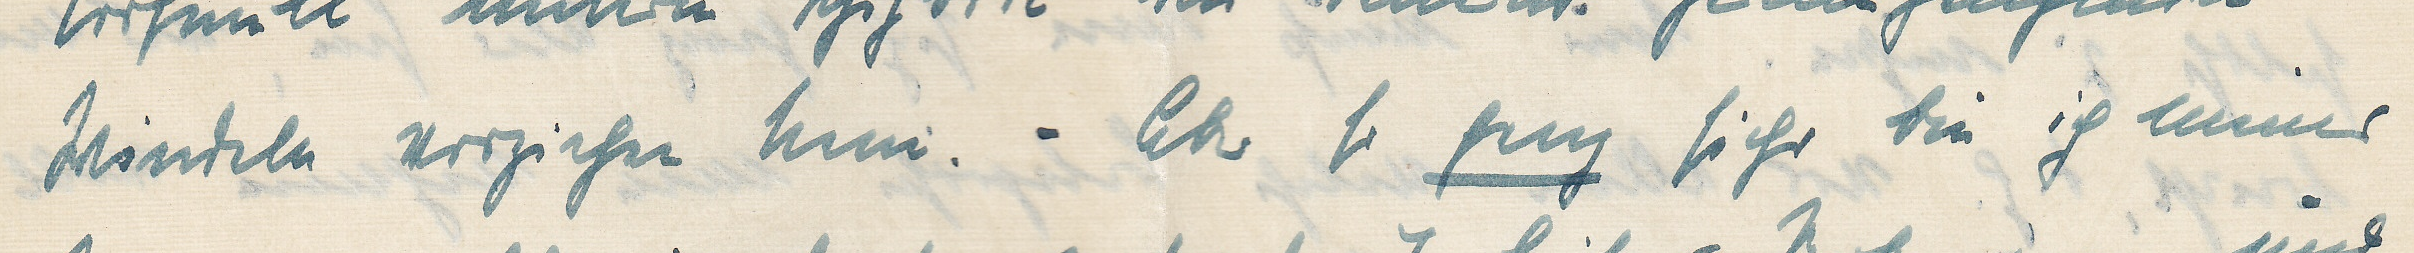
kinhel¬ 2ri hen un. O. az. ise i g m
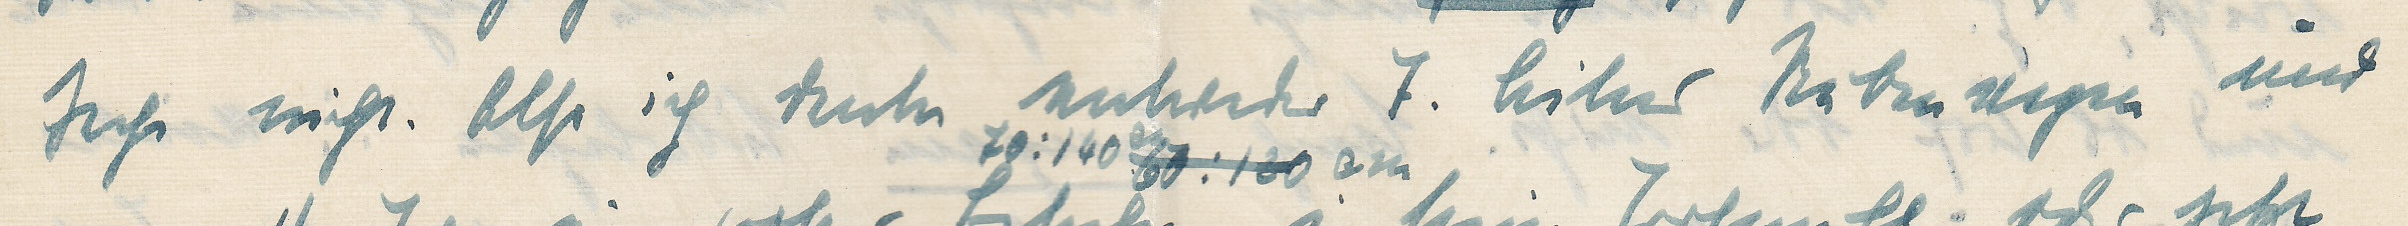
. icht. Etse Sut. ensübo I. Reitnsl . er gen rons
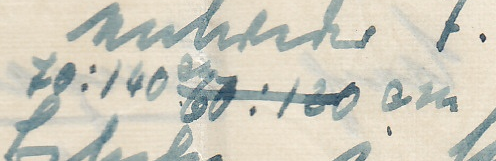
10 .nn ein
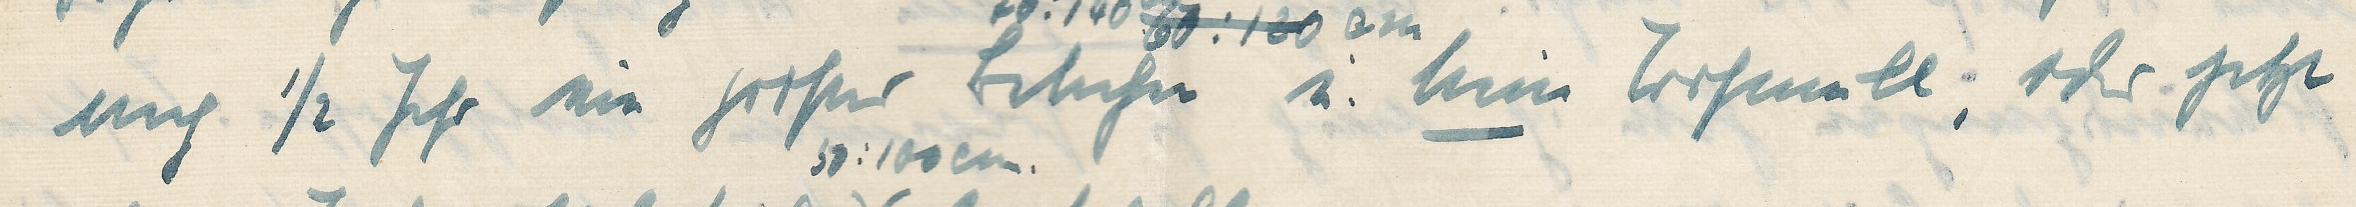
ig si Jf einr he1snd.etichn s. i .kl,. ht
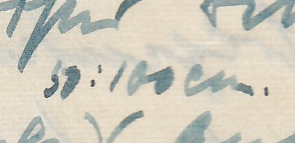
10 e¬.
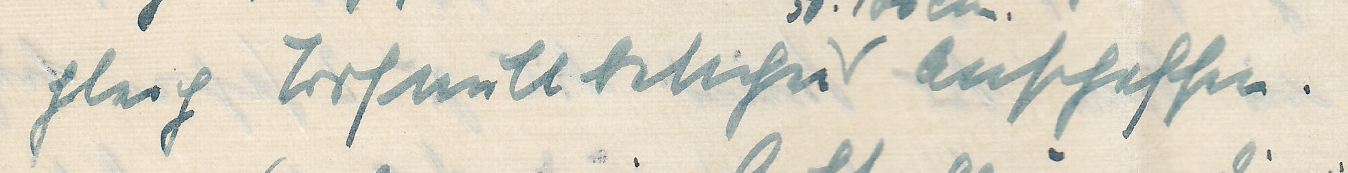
le. orhiticfeir tns fefsn
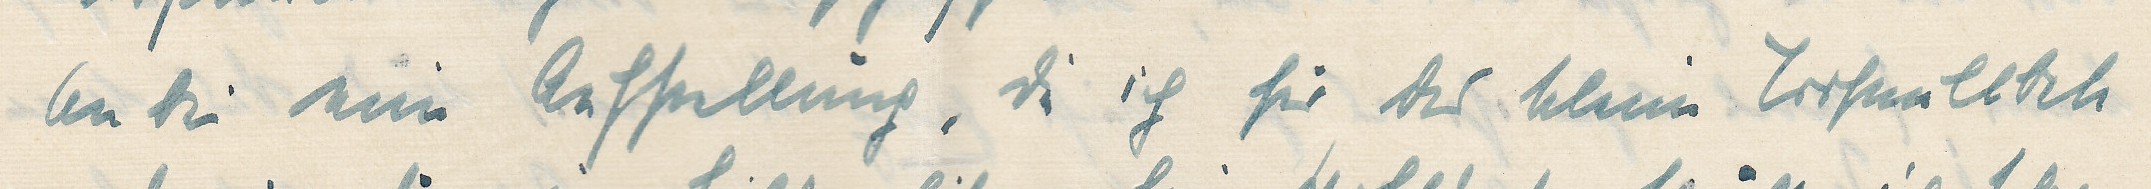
e b Dii E.ssellun ich kes.kkm ..h
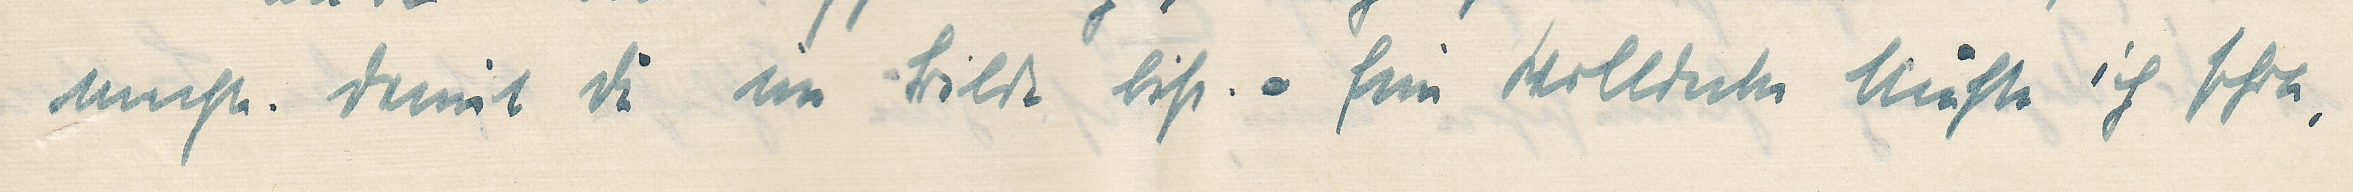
lmst. Dmitd r ltr bis. Ien. stollhete mest. Ech h¬
